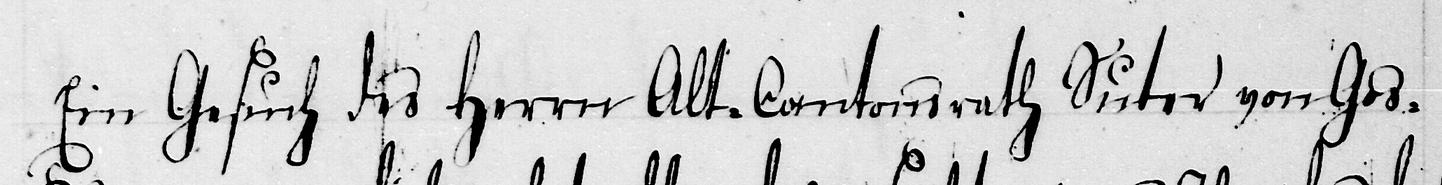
Ein Gesuch des Herrn Alt-Cantonsrath Suter von Gos¬
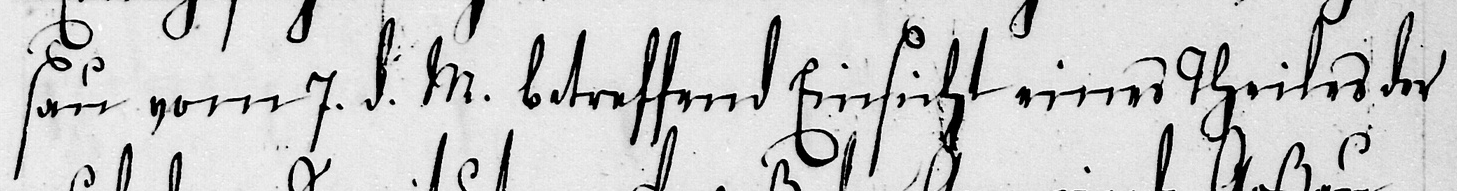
sau vom 7. d. M. betreffend Einsicht eines Theiles der
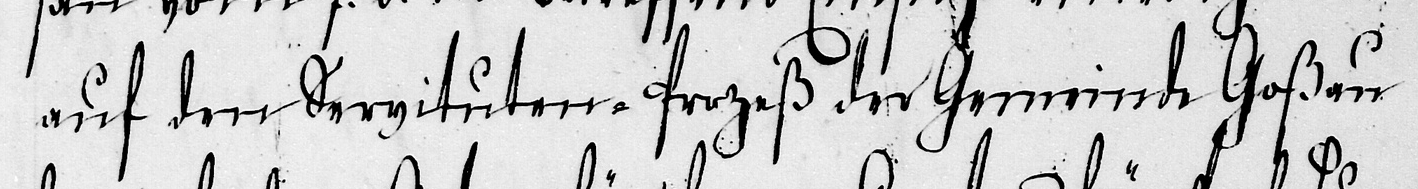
auf den Servituten-Prozeß der Gemeinde Goßau
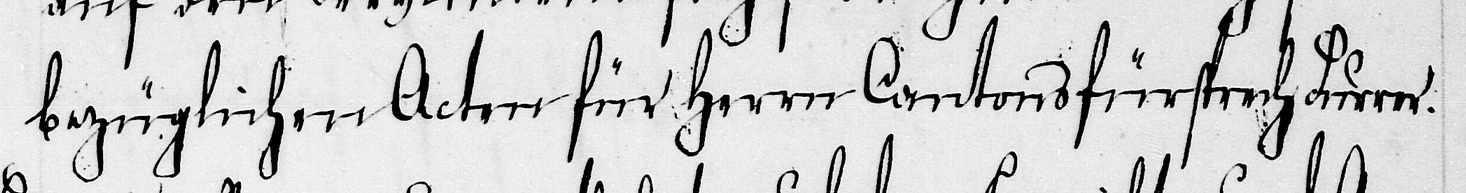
bezüglichen Acten für Herrn Cantonsfürsprech Furre¬
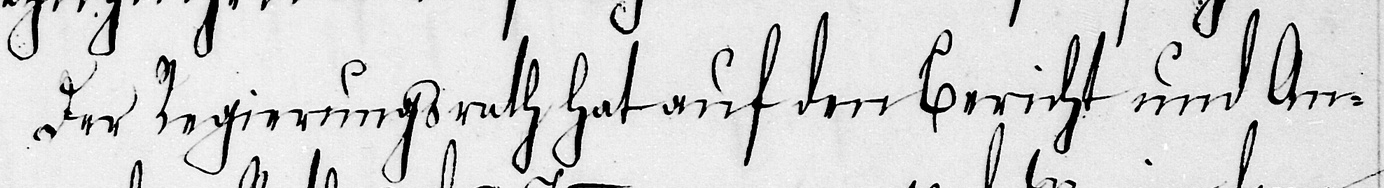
Der Regierungsrath hat auf den Bericht und An¬
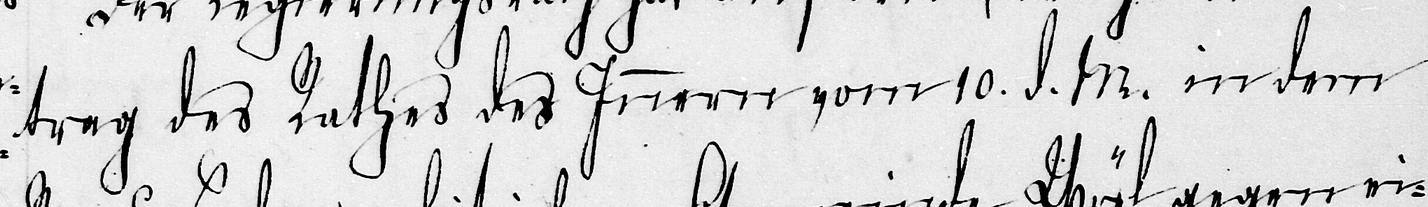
trag des Rathes des Innern vom 10. d. M. in dem
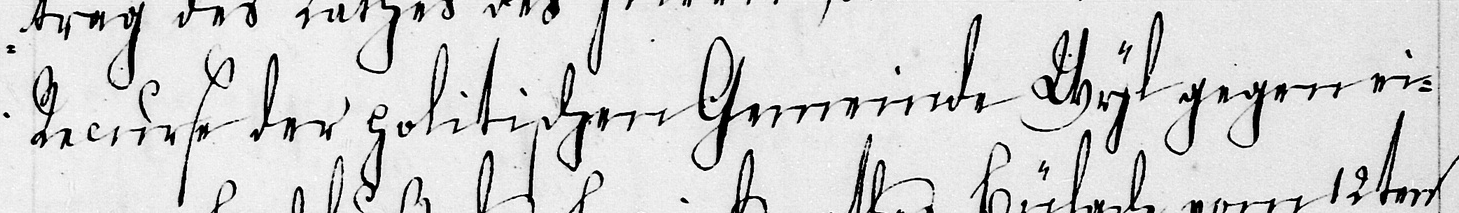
Recurse der politischen Gemeinde Wyl gegen ei¬
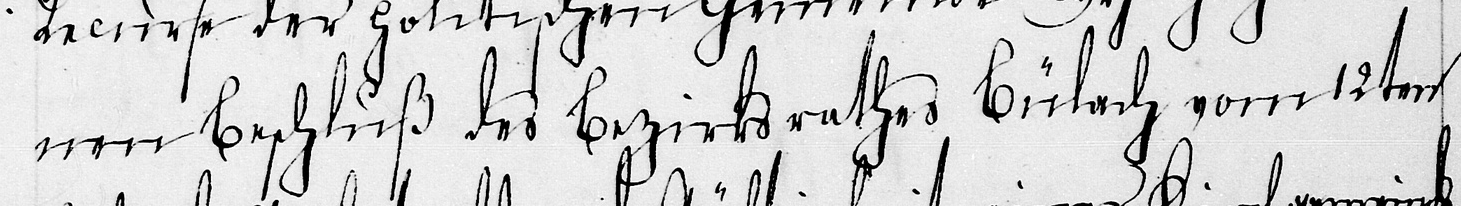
nen Beschluß des Bezirksrathes Bülach vom 12ten
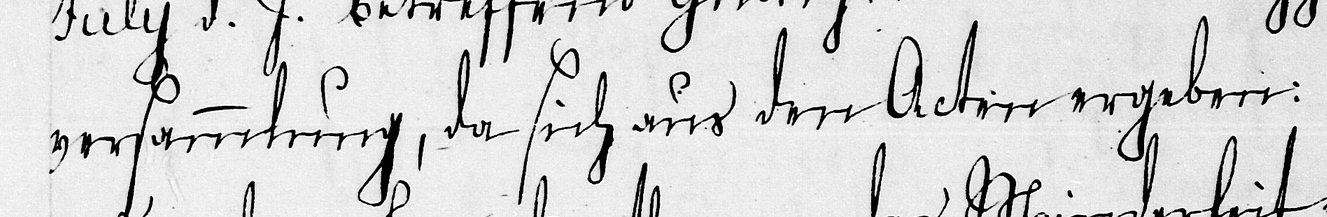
versammlung, da sich aus den Acten ergeben:
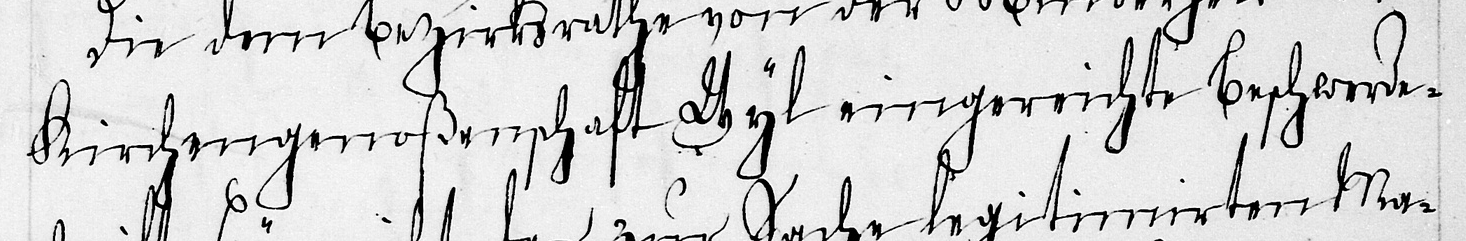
Kirchgenoßenschaft Wyl eingereichte Beschwerde¬
